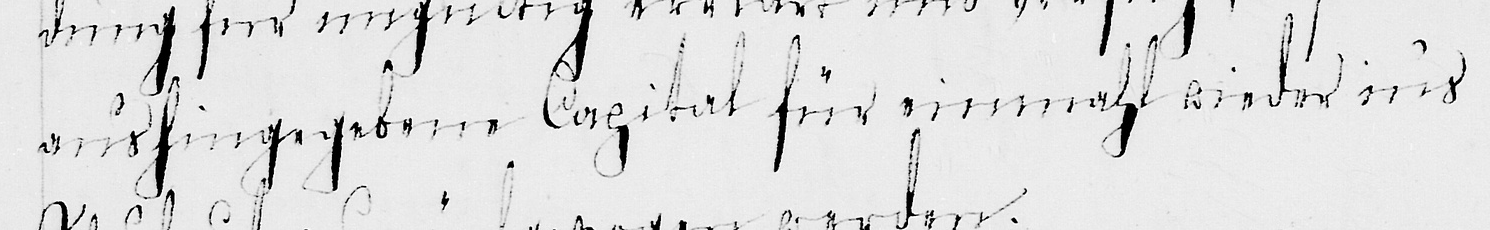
aushingegebene Capital für einmahl wieder ins
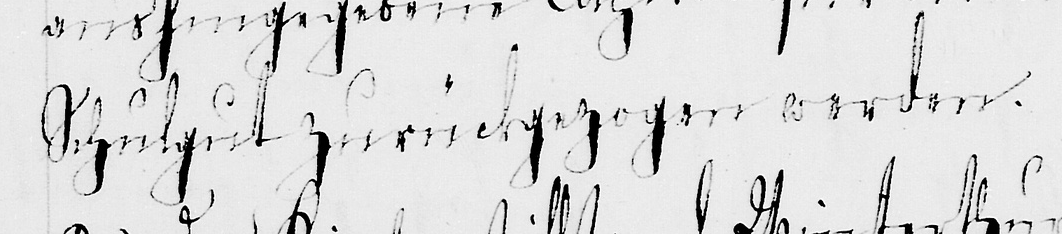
Schulgut zurückgezogen werden.
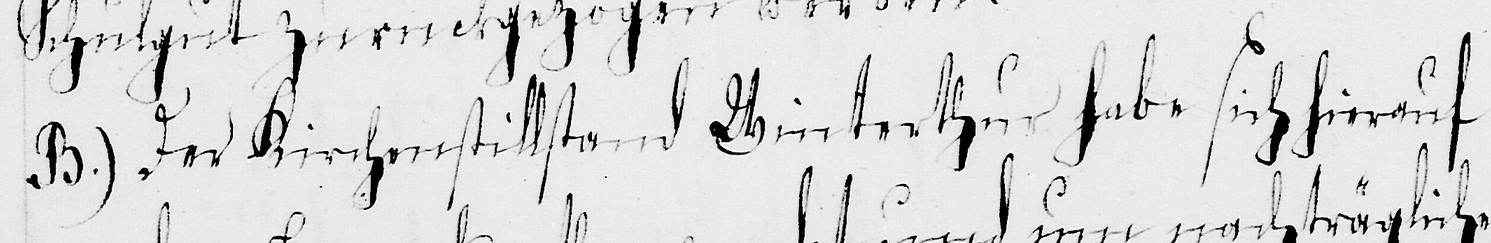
B.) Der Kirchenstillstand Winterthur habe sich hierauf
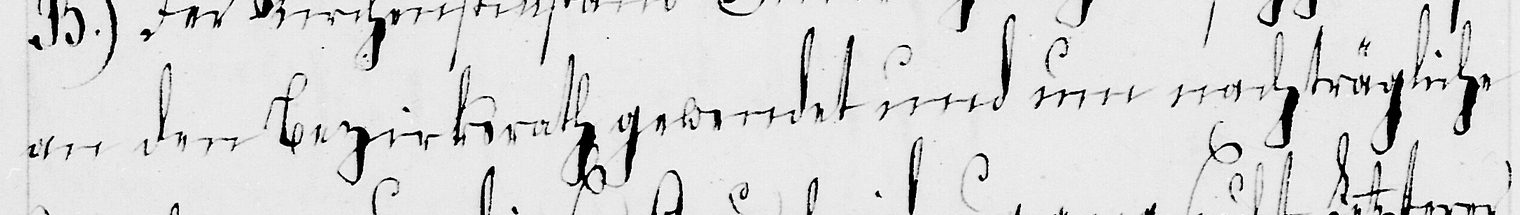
an den Bezirksrath gewendet und um nachträgliche
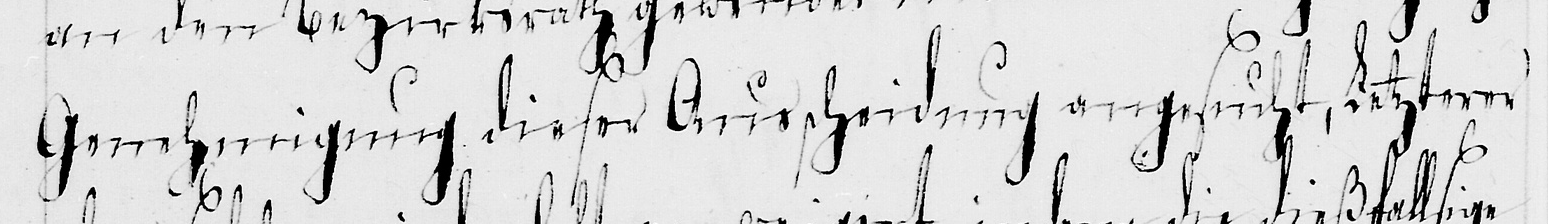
Genehmigung dieser Ausscheidung angesucht, Letzterer
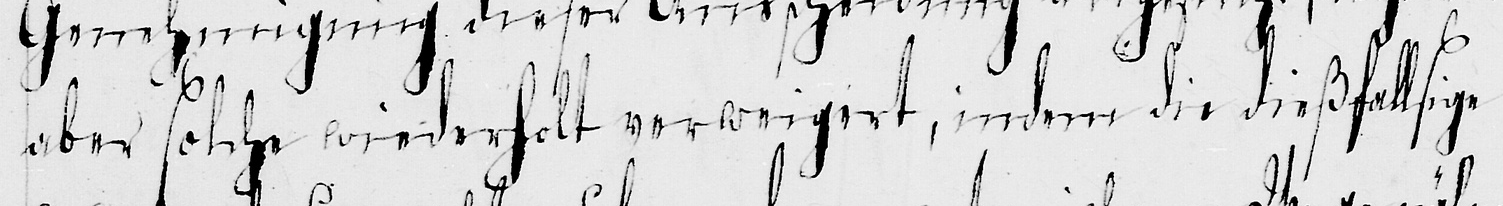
aber solche wiederholt verweigert, indem die dießfallsige
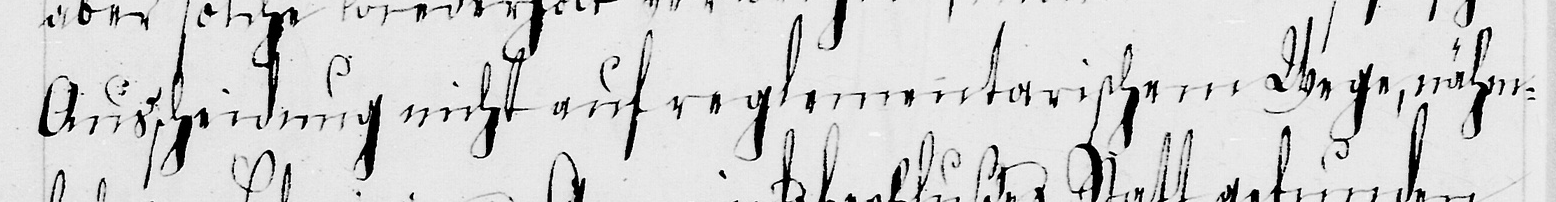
Ausscheidung nicht auf reglementarischem Wege, nähm¬
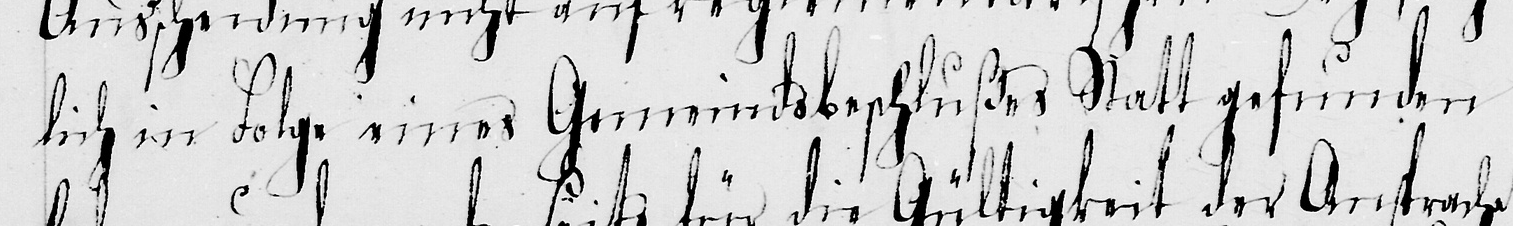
lich in Folge eines Gemeindsbeschlußes Statt gefunden
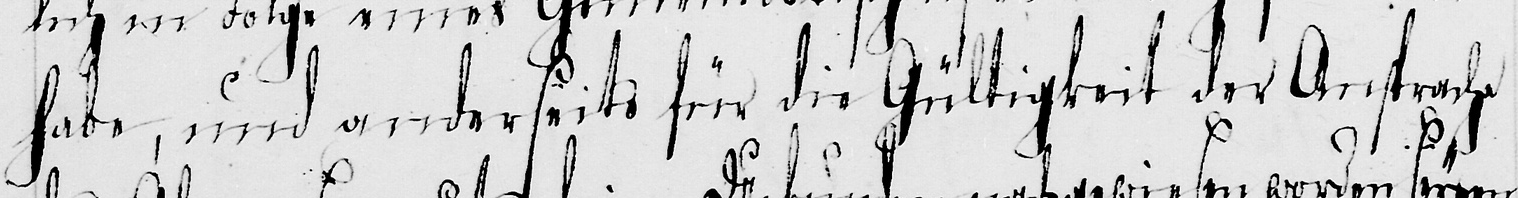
habe, und anderseits für die Gültigkeit der Ansprache
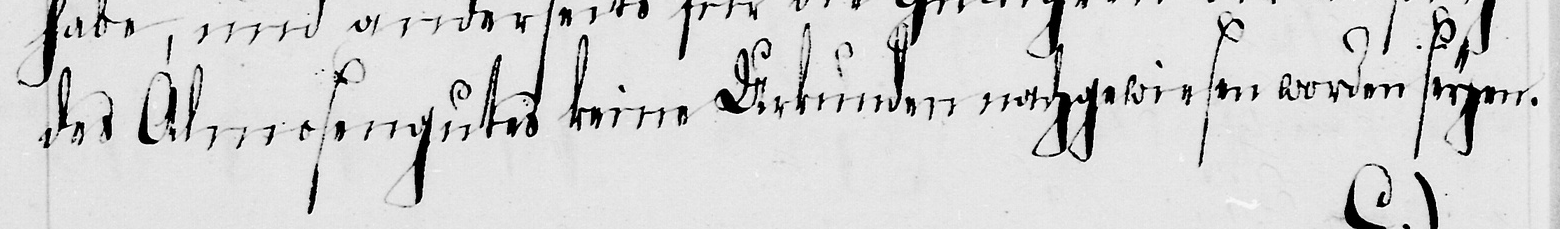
des Almosengutes keine Urkunden nachgewiesen worden seyen.
